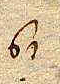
61
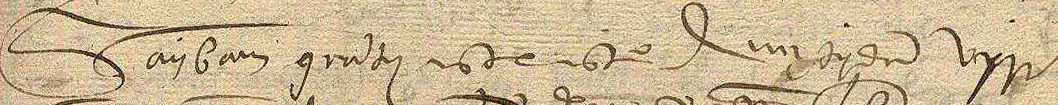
Saybam quātꝯ este esto de certydā vyrē
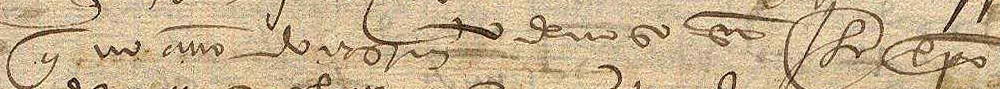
q̄ no āno do nasjmto de noso s̄or Jhū x̄po
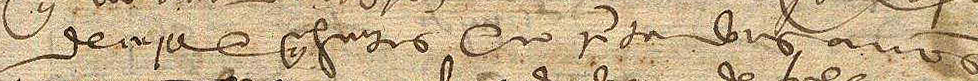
de mjll e q̄nhentos e corēta dous anōs
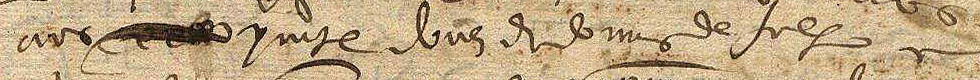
aos vymte dous di do mes de Julho ē
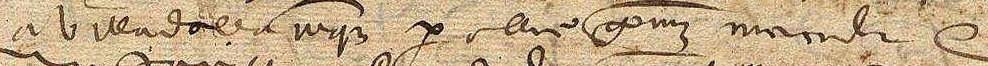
a villa dallamq̄r ꝑ alluo gomez mercador e
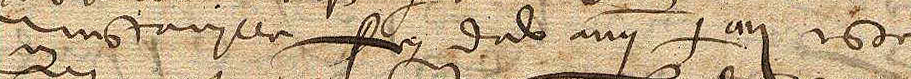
mor nesta ujlla foy dado a mj̄ tam esta
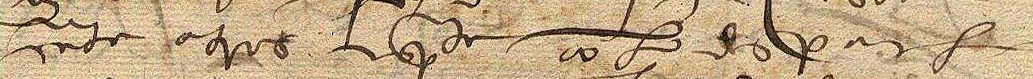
cāta atras esp̄ta c̄o ho despacho
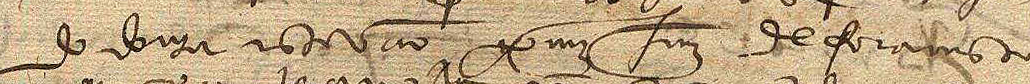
do doutor estevão gomez Juiz de fora nesta
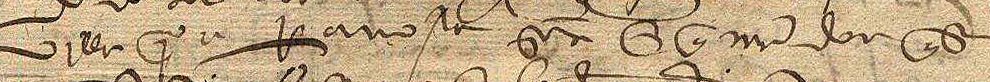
villa p̄o a Ra nossa sr̄a ē q̄ mādou q̄ se
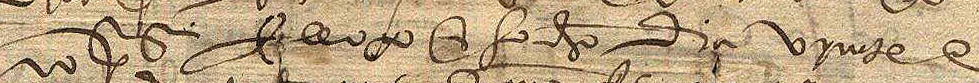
cōp̄se E llogo ē ho dto dia vymte e
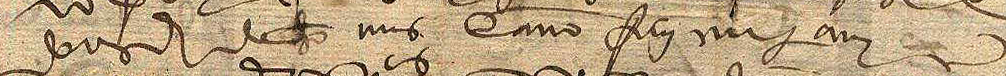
dous di do dt̄o mes e ano fuy eu tam ē
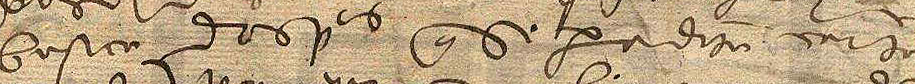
busca das pas q̄ se ꝑ a dita carta
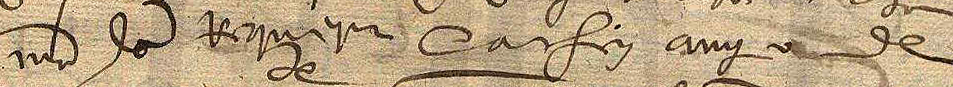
mādā Requerer e achey amto de
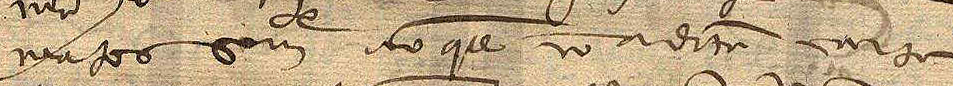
matos somte ao q̄ll c̄o a dita carta
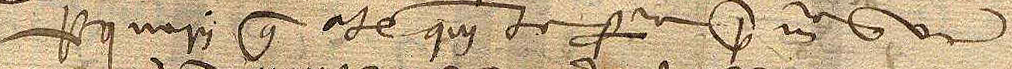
Requery q̄ ate quj̄ta fra p̄mra q̄ vē
